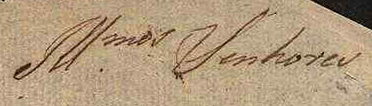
Ill.mos Senhores
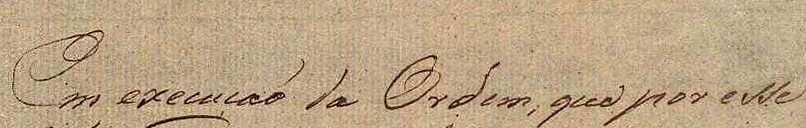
Em execuçaõ da Ordem, que por esse
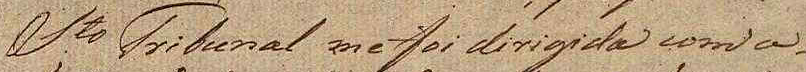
S.to Tribunal me foi dirigida com a
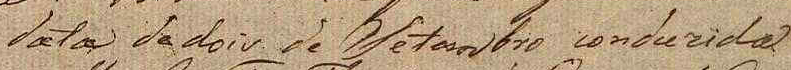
data de dois de Setembro conduzida
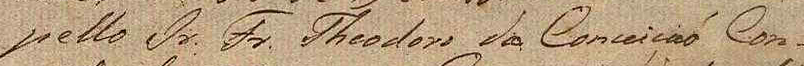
pello Ir. Fr. Theodoro da Conceiçaõ Con
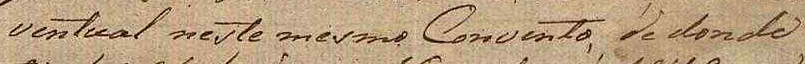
ventual neste mesmo Convento, de donde
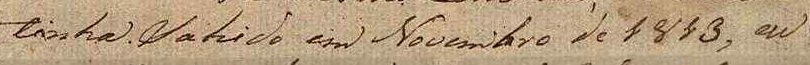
tinha Sahido em Novembro de 1813, eu
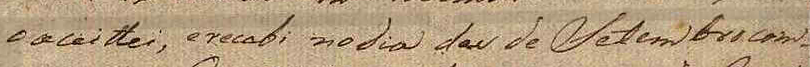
o aceittei, e recebi no dia des de Setembro com
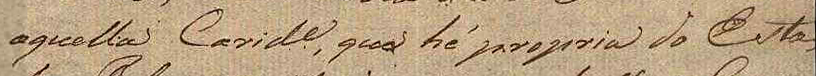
aquella Carid.e, que hé propria do Esta
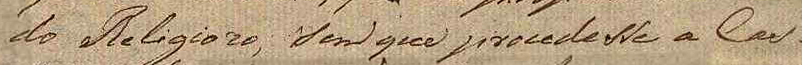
do Religiozo, sem que procedesse a Cas
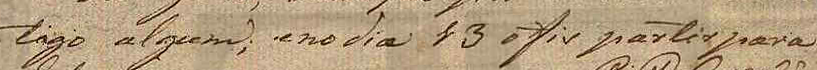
tigo algum; e no dia 13 o fis partir para
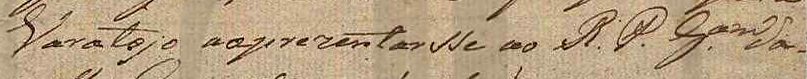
Varatojo a aprezentarsse ao R. P. G.am da
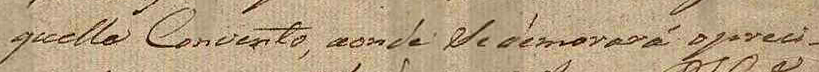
quelle Convento, aonde se demorará o preci
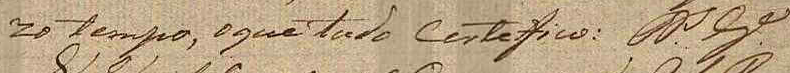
zo tempo, o que tudo Certefico: D.s G.e
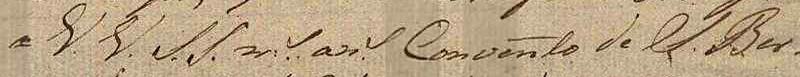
a V.V. SS. m.s an.s Convento de S. Ber
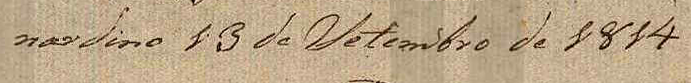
nardino 13 de Setembro de 1814
